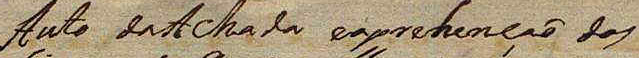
Auto da Achada e aprehenção dos
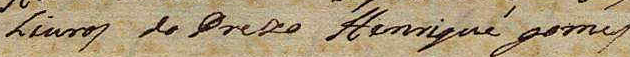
Liuros do Prezo Henrique Gomes
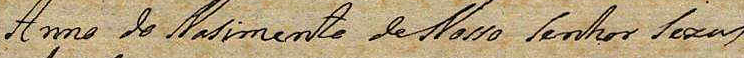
Anno do Nascimento de Nosso Senhor Iezus
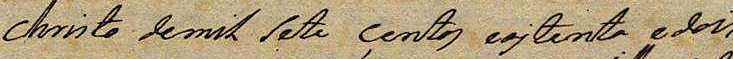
Christo de mil seteçentos e oitenta e dois
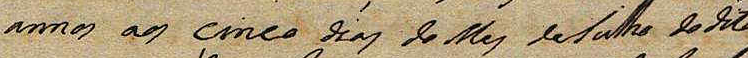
annos aos çinco dias do Mes de Iulho do dito
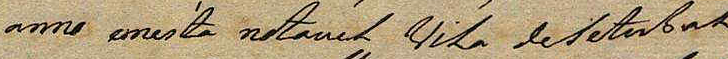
anno em esta notauel Vila de Setubal
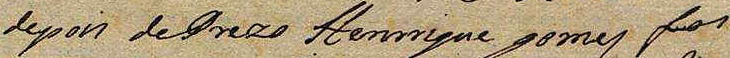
depois de Prezo Henrrique gomes foi
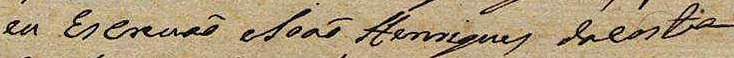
eu Escreuão e Ioão Henriques da costa
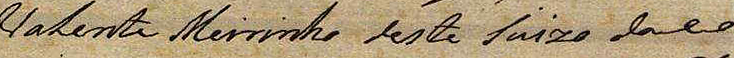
Valente Meirinho deste Iuizo da co
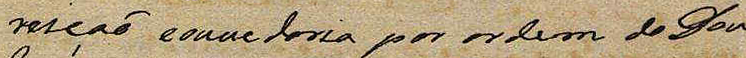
reicaõ e ouuedoria por ordem do Dou
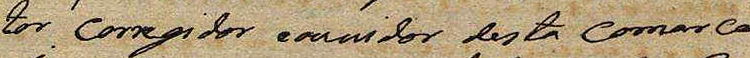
tor Corregidor e ouuidor desta Comarca
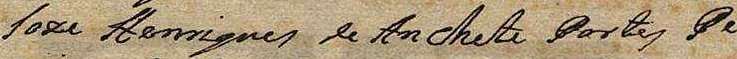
Ioze Henriques de Anchete Portes Pe
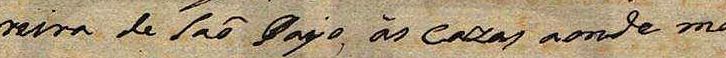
reira de Saõ Payo, às cazas aonde mo
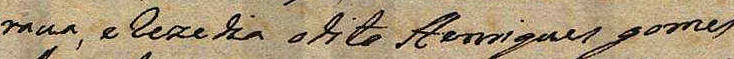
raua, e Rezedia o dito Henriques gomes
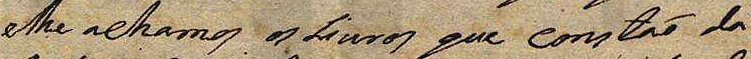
e lhe achamos os Liuros que constão da
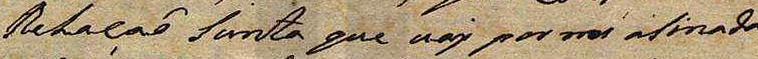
ReLação Iunta que uay por nos asinada
